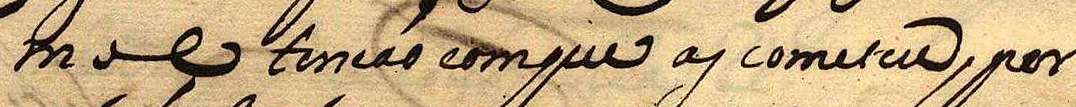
mo, e tenção com que as cometeu, por
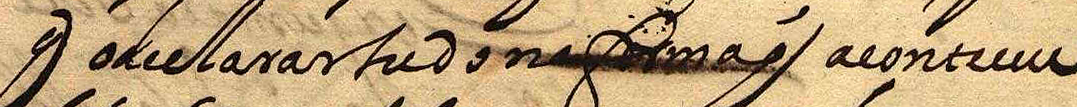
q̄ o declarar tudo na forma q̄ aconteceu
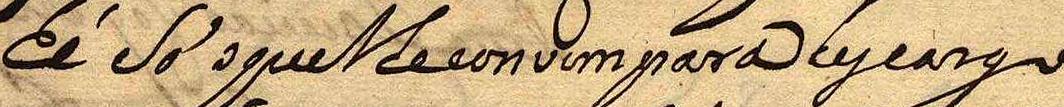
hé Só o que lhe convem para descargo
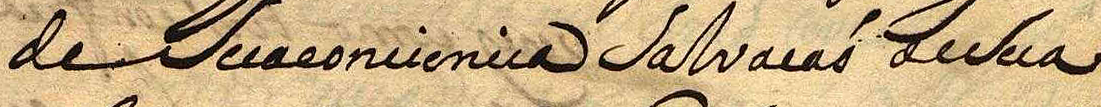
de Sua conciencia Salvaçaõ de Sua
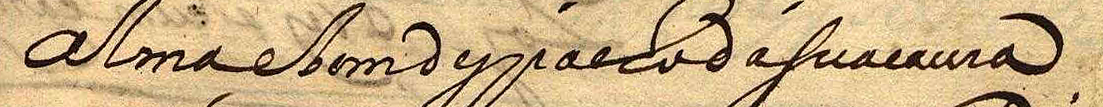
alma, e bom despacho da sua cauza
